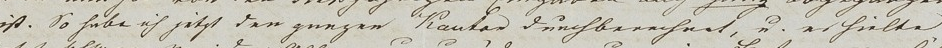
ist. So habe ich jetzt den ganzen Kanton durchberechnet, u. es hielte
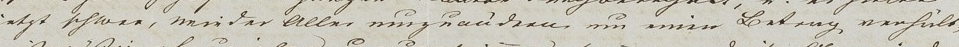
jetzt schwer, wieder Alles umzuändern um einen Betrag verhält-
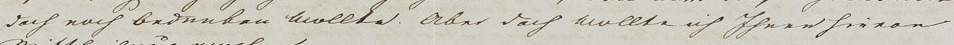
doch noch bedenken wollte. Aber doch wollte ich Ihnen hievon
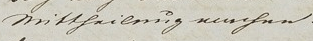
Mittheilung machen.
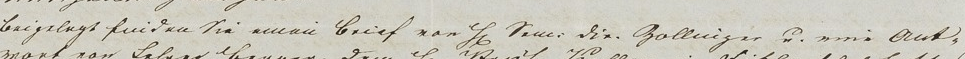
Beigelegt finden Sie einen Brief von Herrn Sem.Dir. Zollinger u. eine Ant-
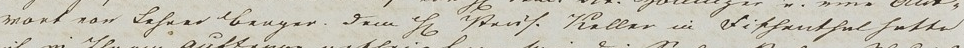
wort von Lehrer Berger. Dem Herrn Präs. Keller in Fischenthal hatte
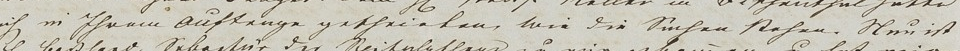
ich in Ihrem Auftrage geschrieben, wie die Sachen stehen. Nun ist
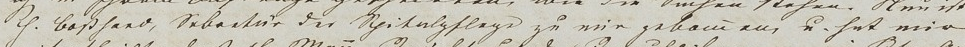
H. Boßhard, Sekretär der Spitalpflege zu mir gekommen, u. hat mir
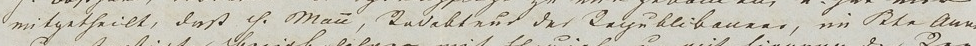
mitgetheilt, daß H. Mann, Redakteur des Republikaners, im Ktn Aar-
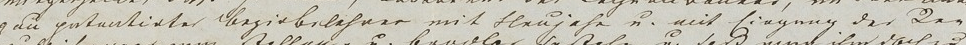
gau patentirter Bezirkslehrer mit Neujahr u. mit Eingang des Re-
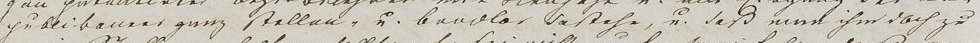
publikaners ganz stellen- u. brodlos dastehe, u. daß man ihm doch zu
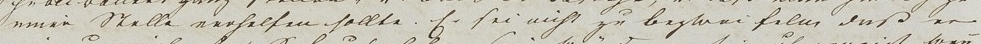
einer Stelle verhelfen sollte. Es sei nicht zu bezweifeln, daß er
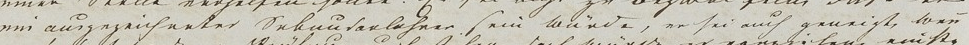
ein ausgezeichneter Sekundarlehrer sein würde, er sei auch geneigt, wenn
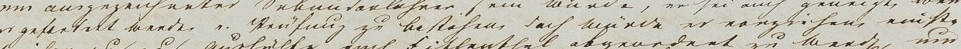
es gefordert werde, e. Prüfung zu bestehen, doch würde er vorziehen, einst-
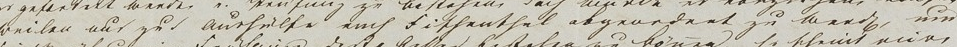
weilen nur zur Aushülfe nach Fischenthal abgeordnet zu werden, um
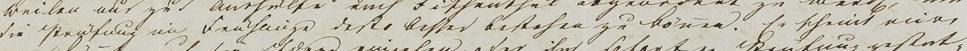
die Prüfung im Frühlinge desto besser bestehen zu können. Es scheint mir,
